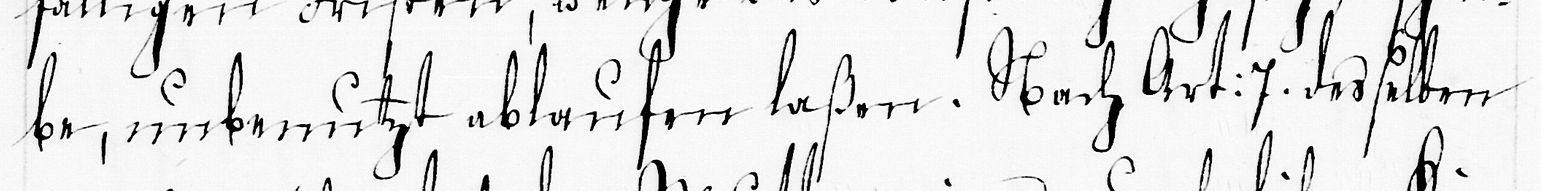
ibe, unbenutzt ablaufen laßen. Nach Art: 7. desselben
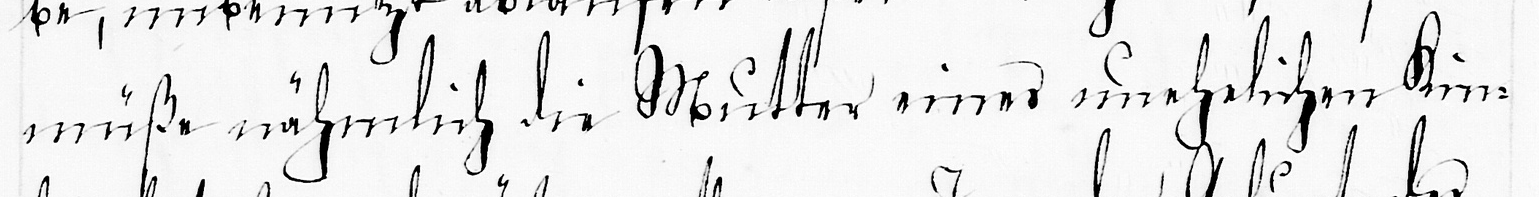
müße nähmlich die Mutter eines unehelichen Kin¬
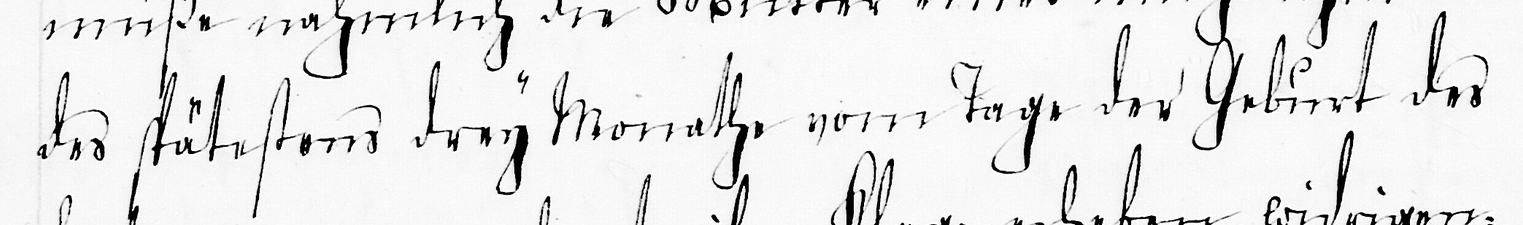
des spätestens drey Monathe vom Tage der Geburt des
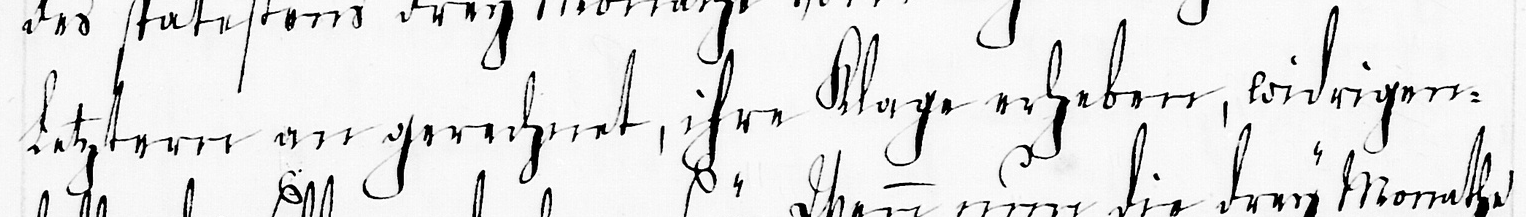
Letztern an gerechnet, ihre Klage erheben, widrigen¬
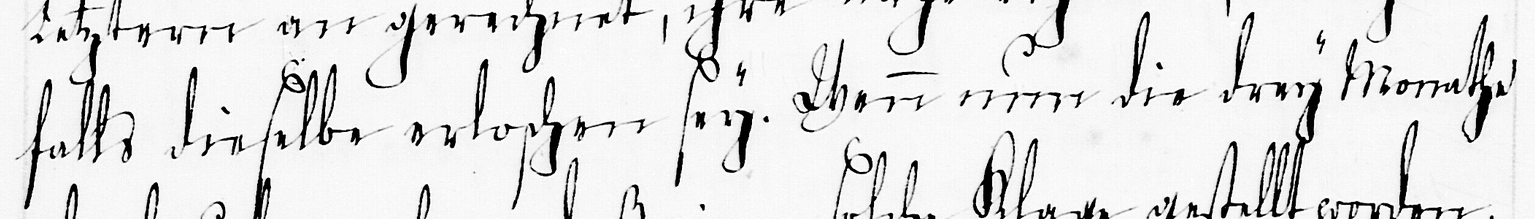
falls dieselbe erloschen sey. Wenn nun die drey Monathe
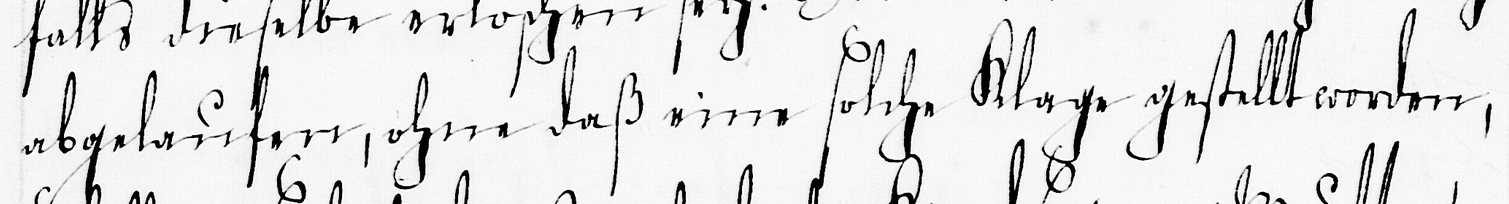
abgelaufen, ohne daß eine solche Klage gestellt worden,
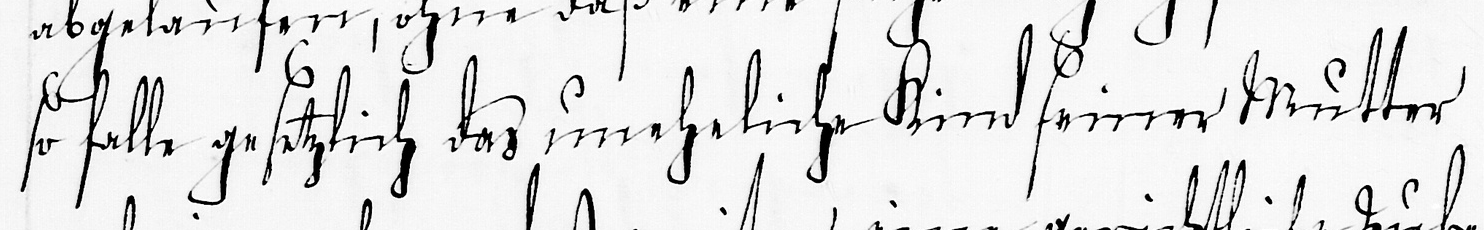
falle gesetzlich das uneheliche Kind seiner Mutter
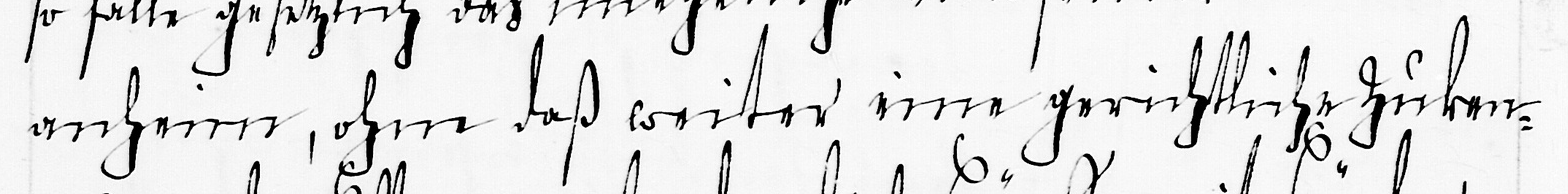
anheim, ohne daß weiter eine gerichtliche Zuken¬
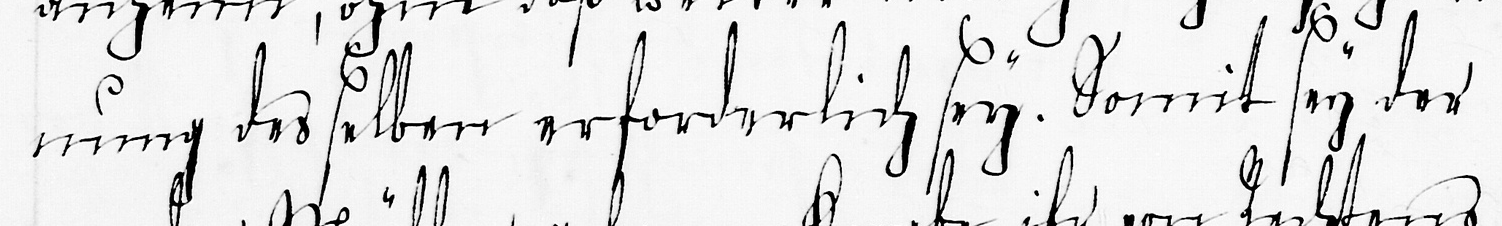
nung desselben erforderlich sey. Somit sey der
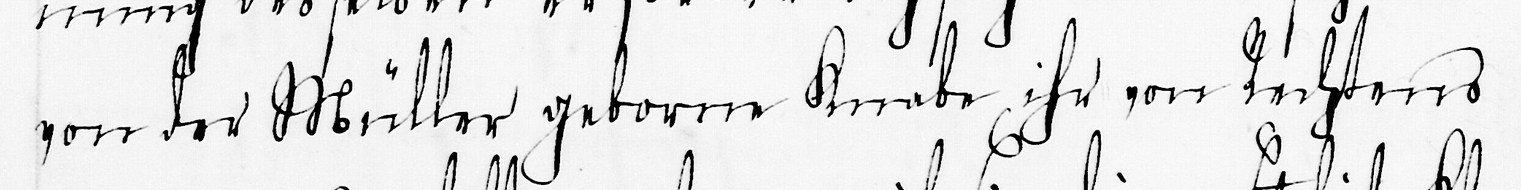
von der Müller geborne Knabe ihr von Rechtens
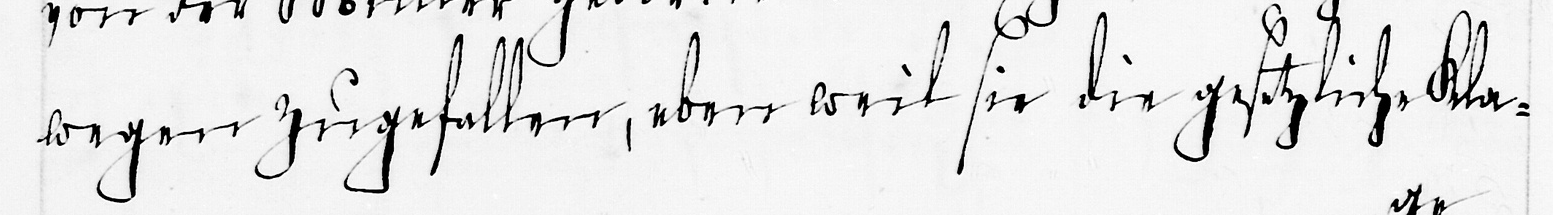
wegen zugefallen, eben weil die gesetzliche Kla-
